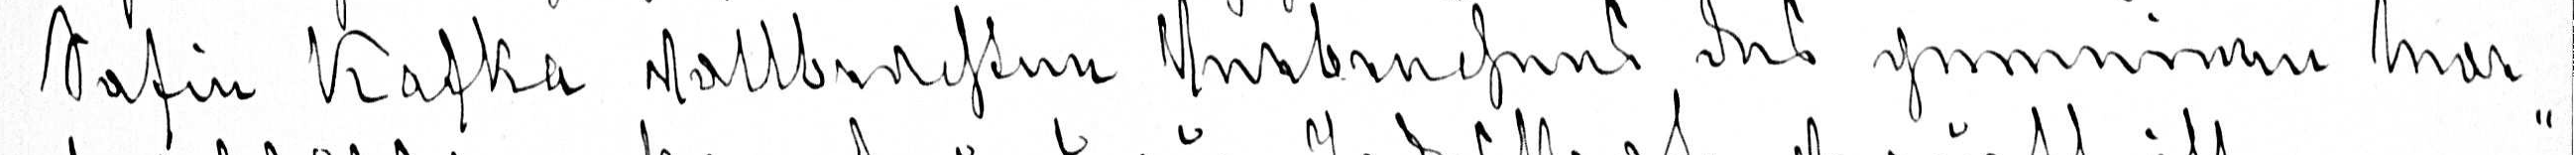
Sofie Kafka vollbrachten Verbrechens des gemeinen Mor¬
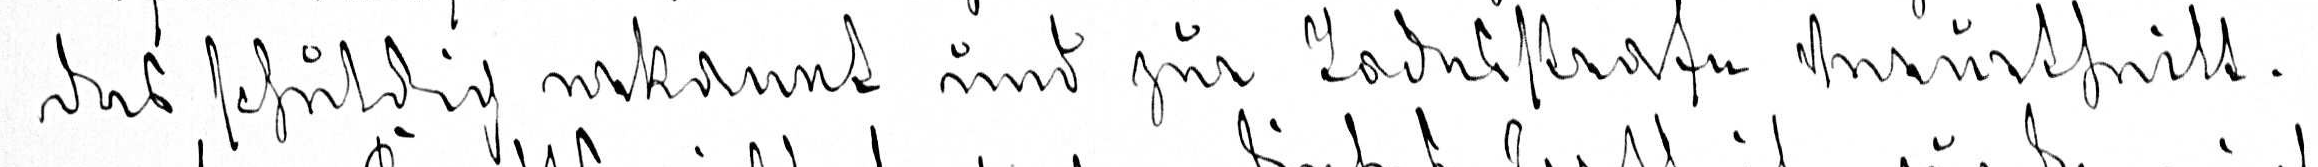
des schuldig erkannt und zur Todesstrafe verurtheilt.
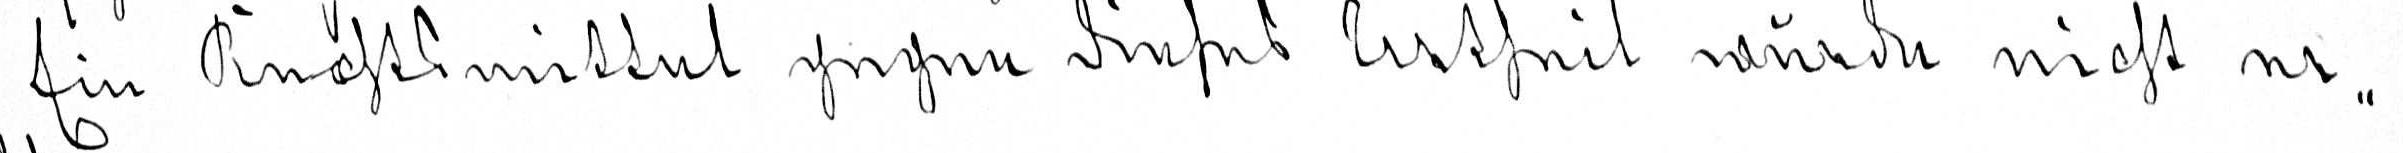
Ein Rechtsmittel gegen dieses Urtheil wurde nicht er¬
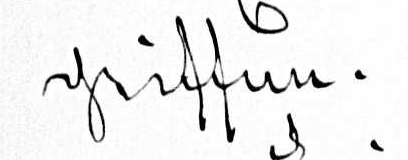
griffen
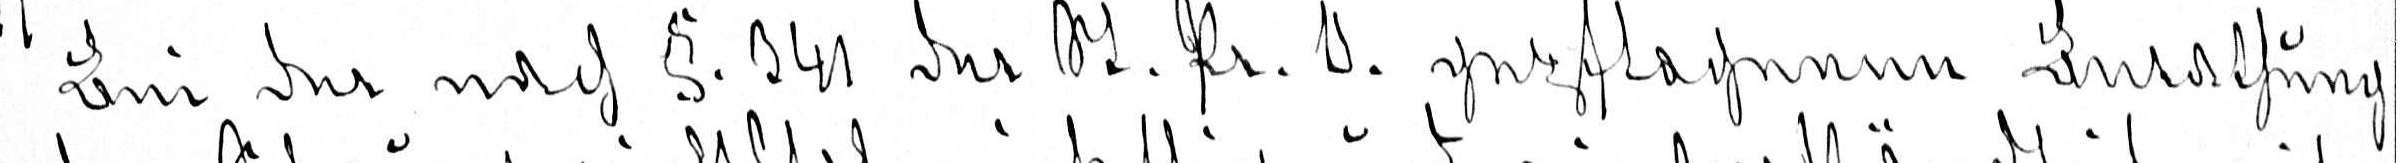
Bei der nach §341 der St. Pr. O. gepflogenen Berathung
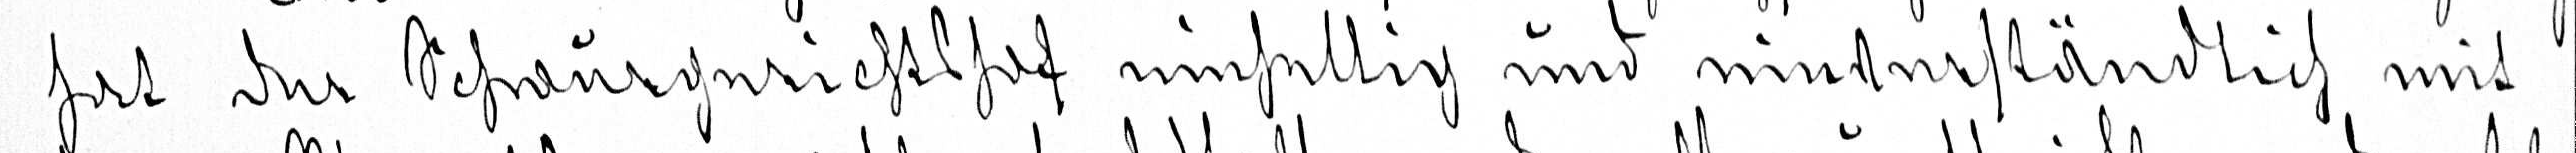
hat der Schwurgerichtshof einhellig und einverständlich mit
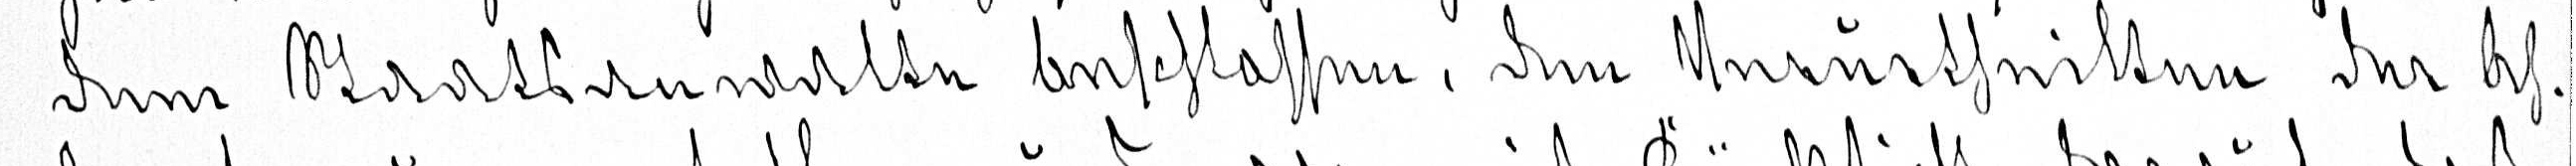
dem Staatsanwalte beschlossen, den Verurtheilten der Ah.
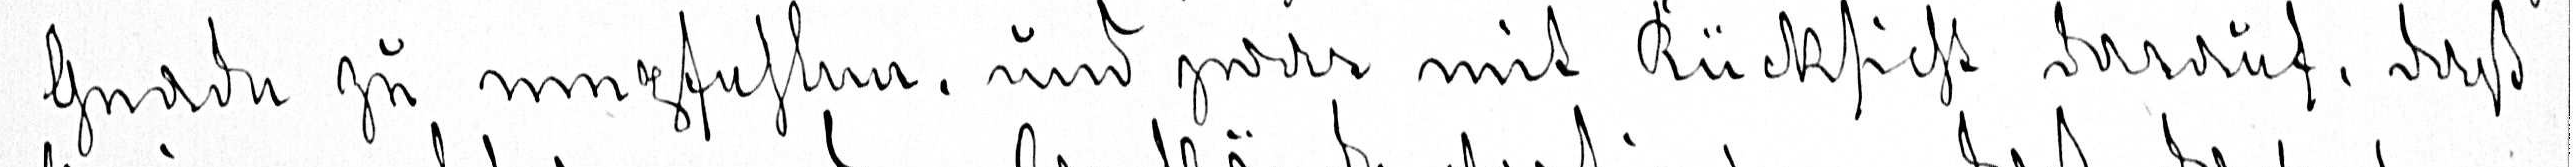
Gnade zu empfehlen, und zwar mit Rücksicht darauf, daß
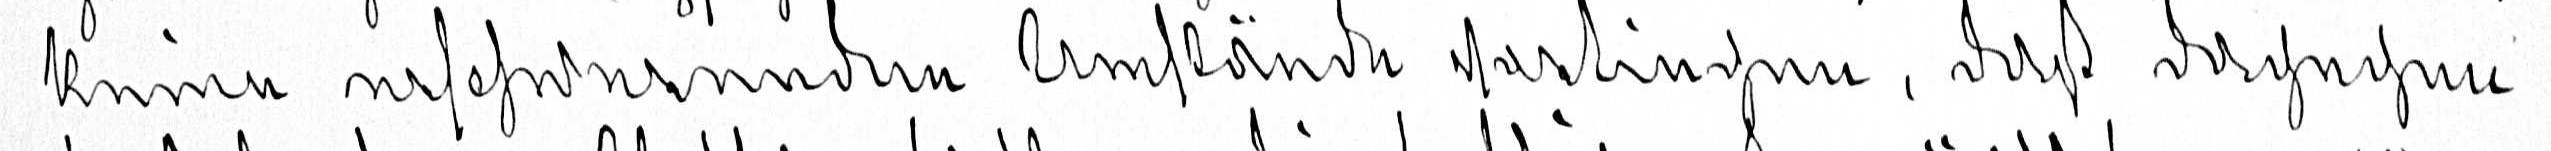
keine erschwerenden Umstände verliegen, daß dagegen
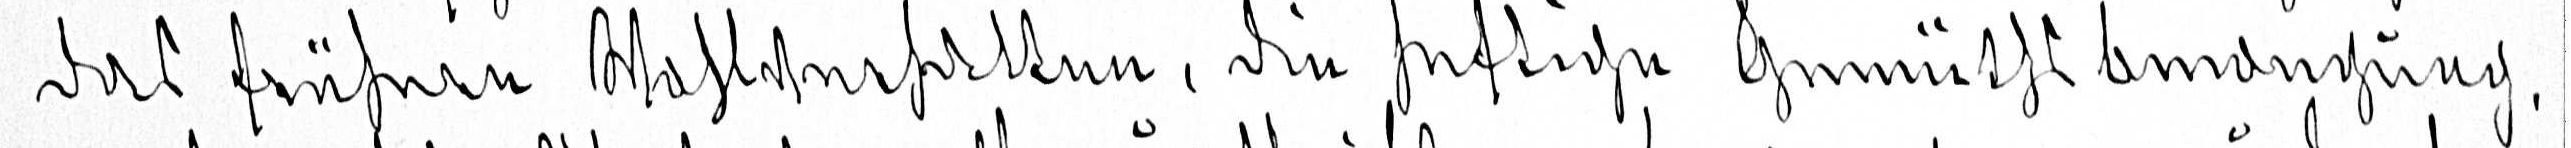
das frühre Wohlverhalten, die heftige Gemüthsbewegung,
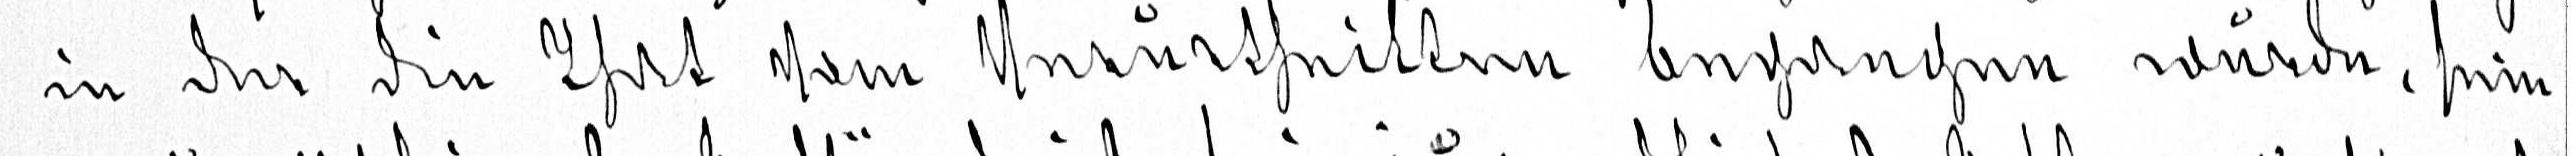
in der die That vom Verurtheilten begangen wurde, sein
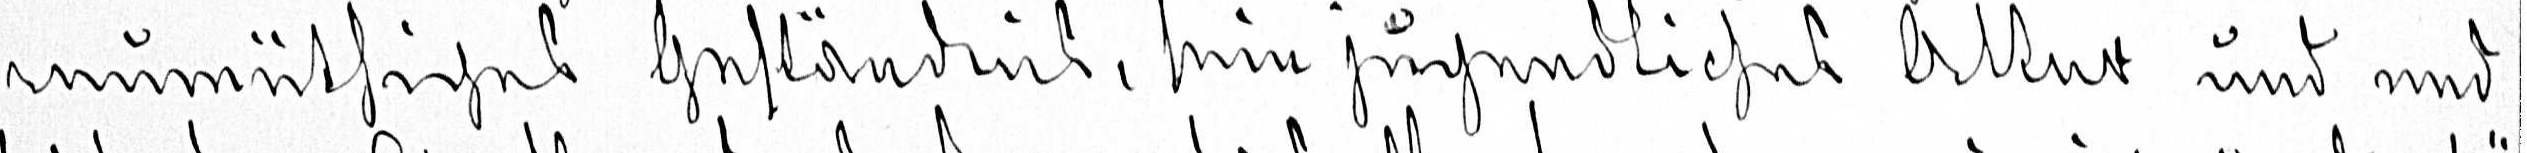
reumüthiges Geständnis, sein jugendliches Alter und end¬
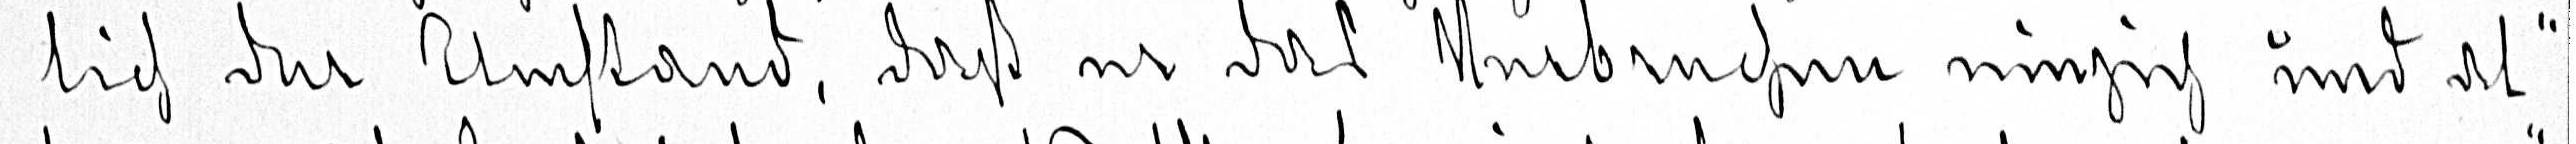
lich der Umstand, daß er das Verbrechen einzig und al¬
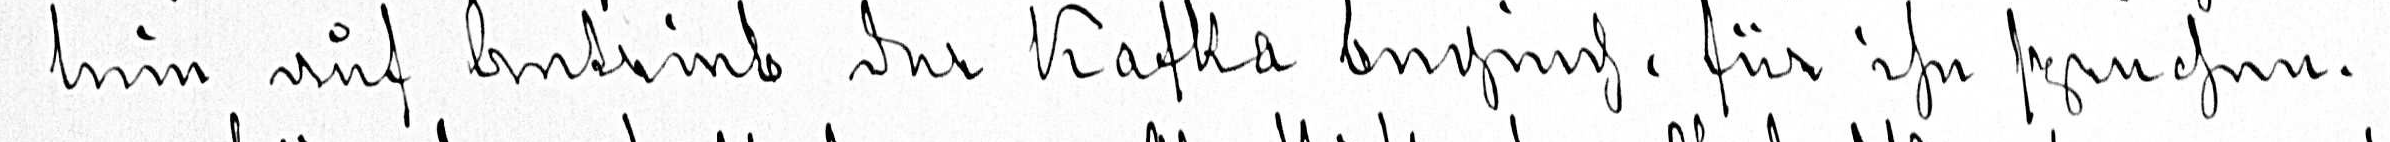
lein auf Antrieb der Kafka beging, für ihn sprechen.
